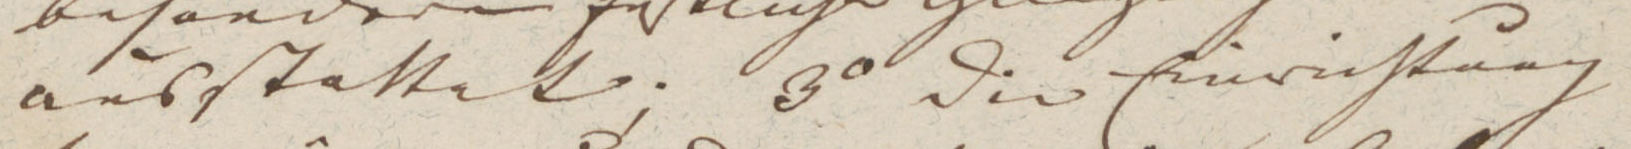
ausstattet; 3° die Einrichtung
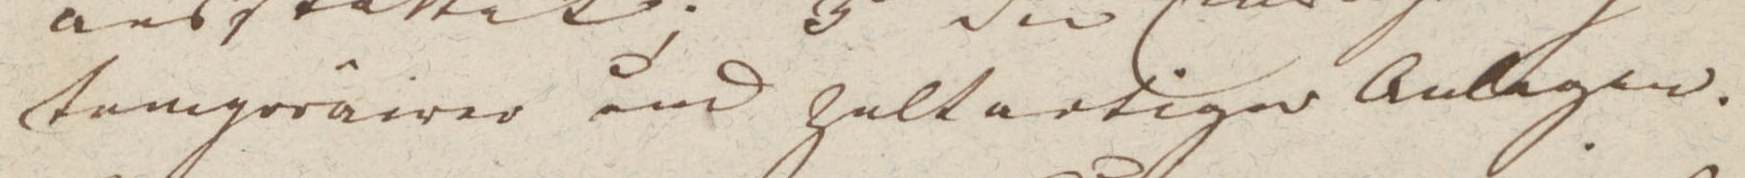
temporäirer und zeltartiger Anlagen.
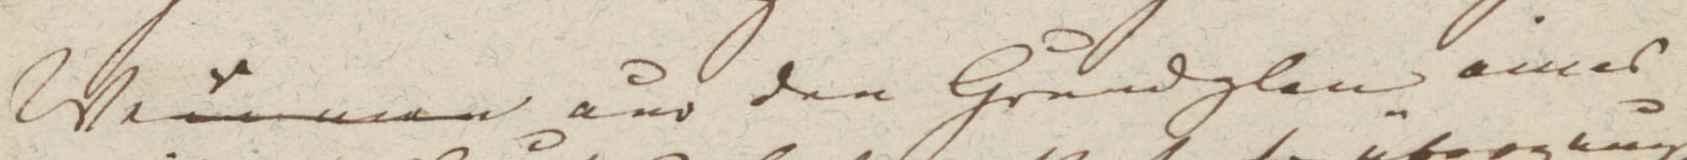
Wenn manr nur den Grundplan eines
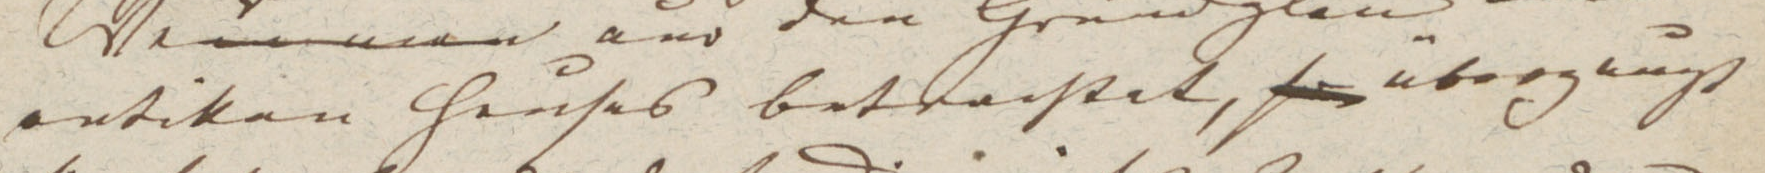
antiken Hauses betrachtet, so überzeugt
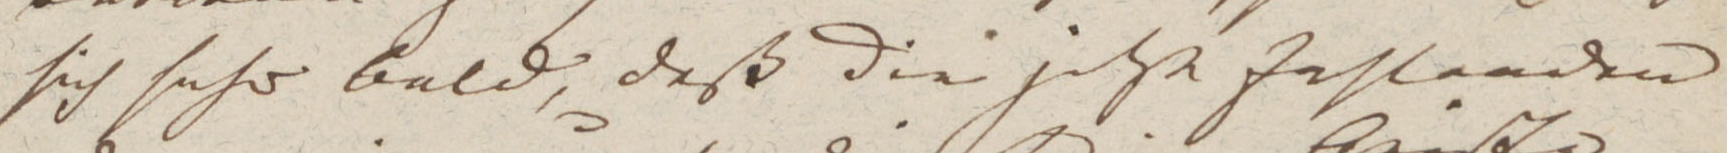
sich sehr bald, dass die jetzt fehlenden
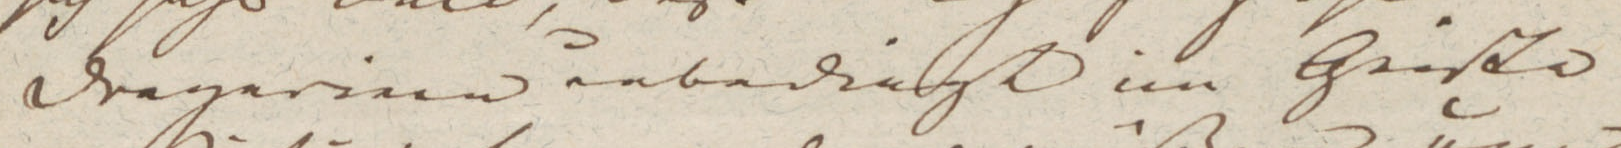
Draperieen unbedingt im Geiste
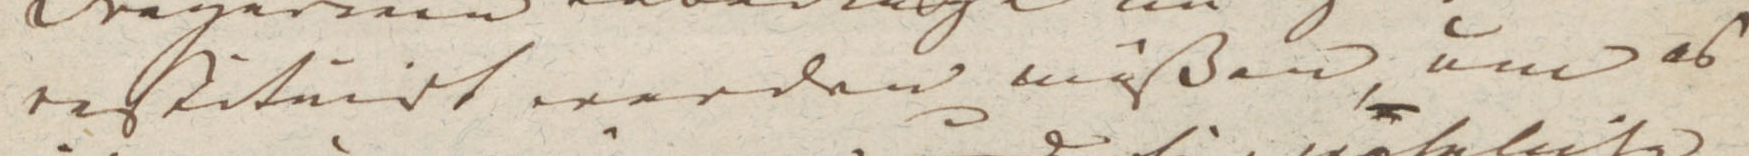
restituirt werden müssen, um es
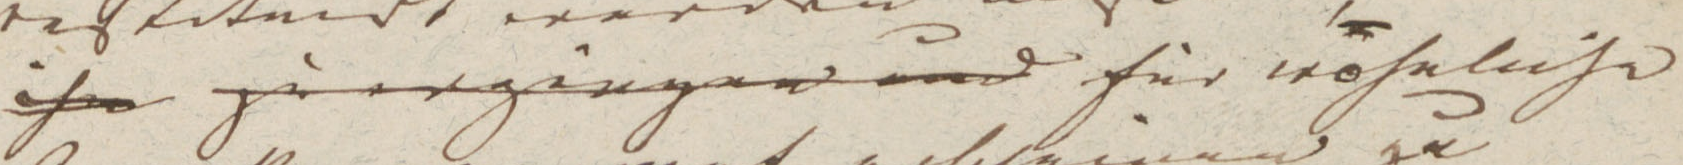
ihn zu erzeugen und für wöohnliche
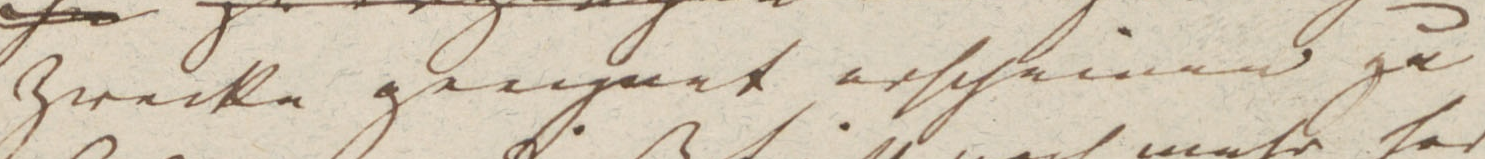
Zwecke geeignet erscheinen zu
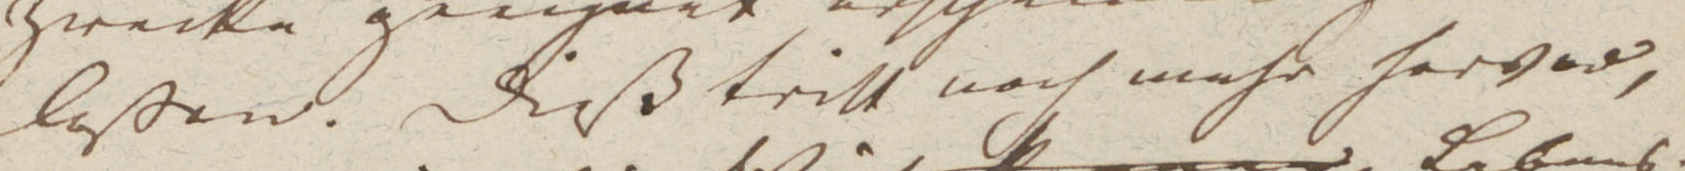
lassen. Diess tritt noch mehr hervor,
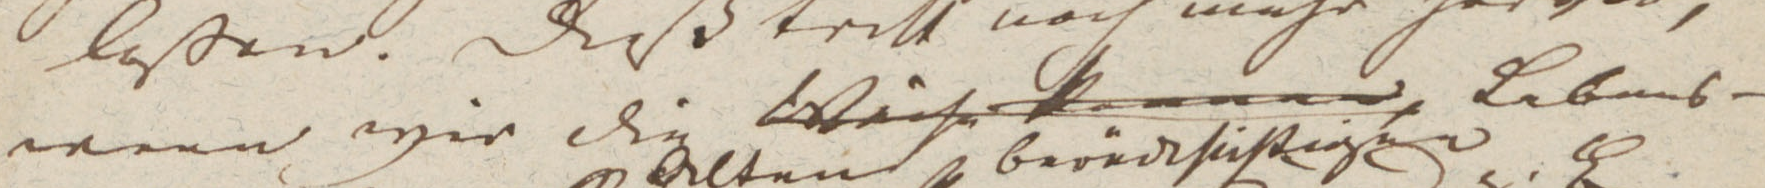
wenn wir die Weise kennen, Lebens-
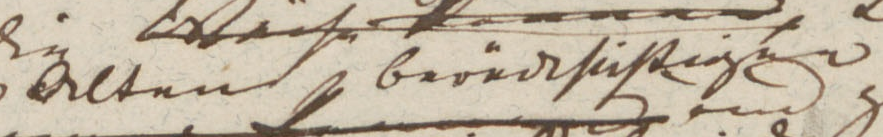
Alten berücksichtigen
